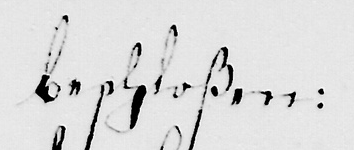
beschloßen:
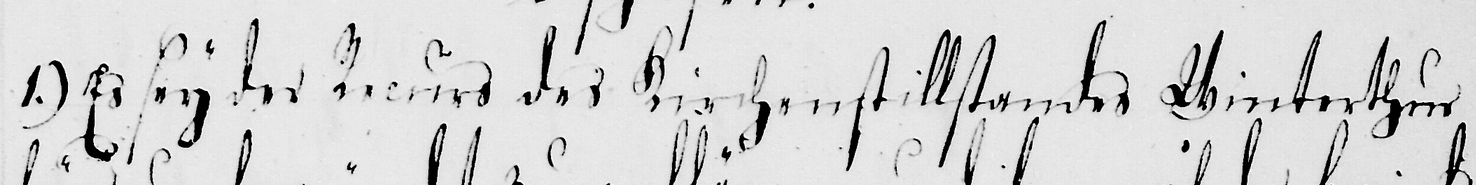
Es sey der Recurs des Kirchenstillstandes Winterthur
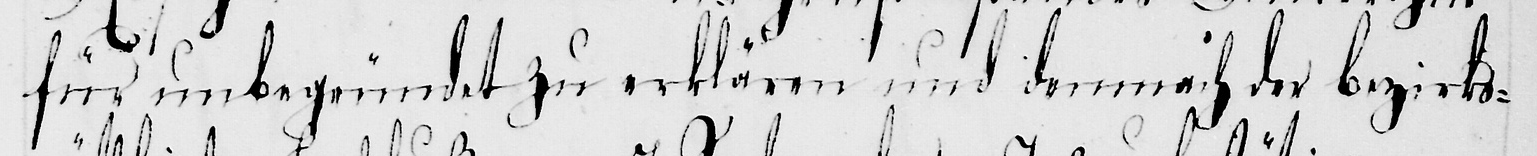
für unbegründet zu erklären und demnach der Bezirks¬
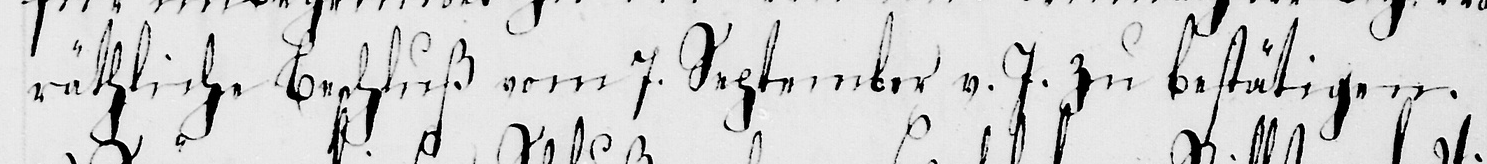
räthliche Beschluß vom 7. September v. J. zu bestätigen.
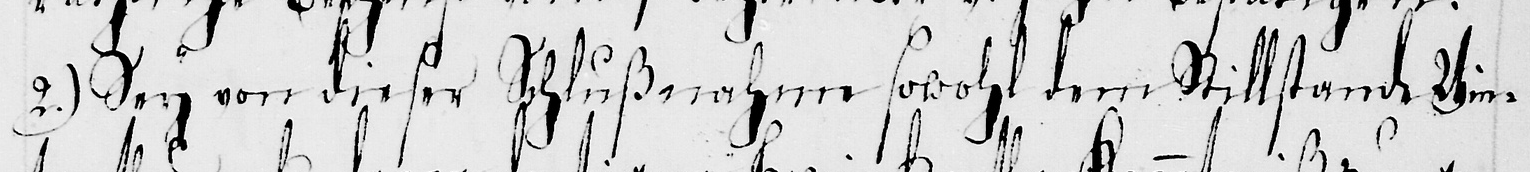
2.) Sey von dieser Schlußnahme sowohl dem Stillstande Win¬
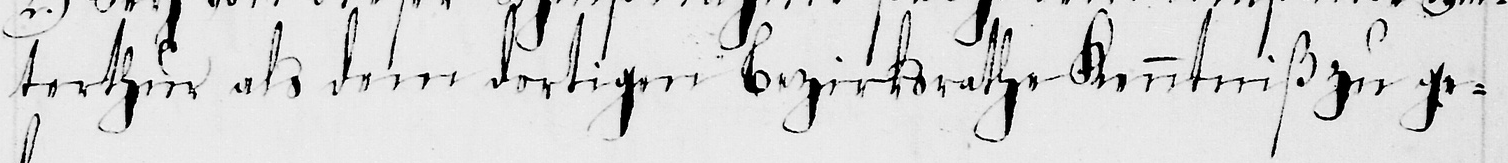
terthur als dem dortigen Bezirksrathe-Kenntniß zu ge¬
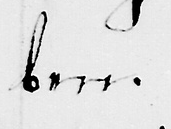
ben.
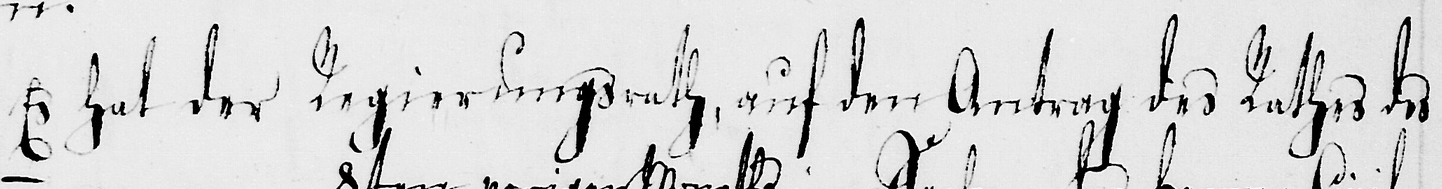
Es hat der Regierungsrath, auf den Antrag des Rathes d¬
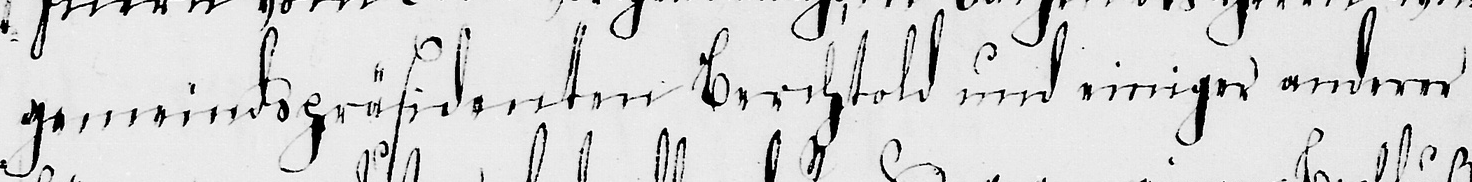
gemeindspräsidenten Berchtold und einiger anderer
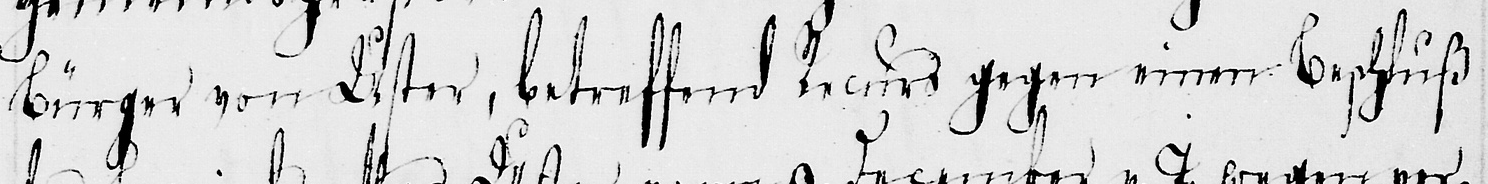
Bürger von Uster, betreffend Recurs gegen einen Beschluß
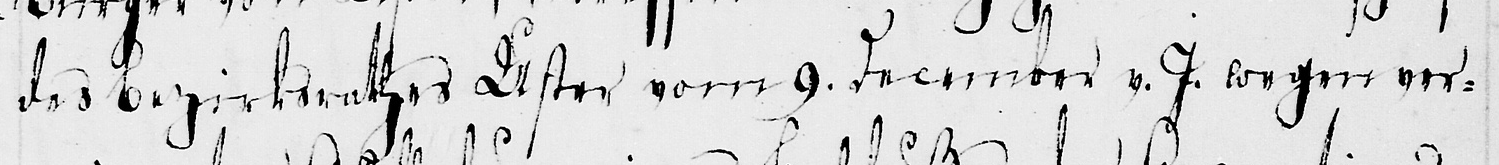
des Bezirksrathes Uster vom 9. December v. J. wegen ver¬
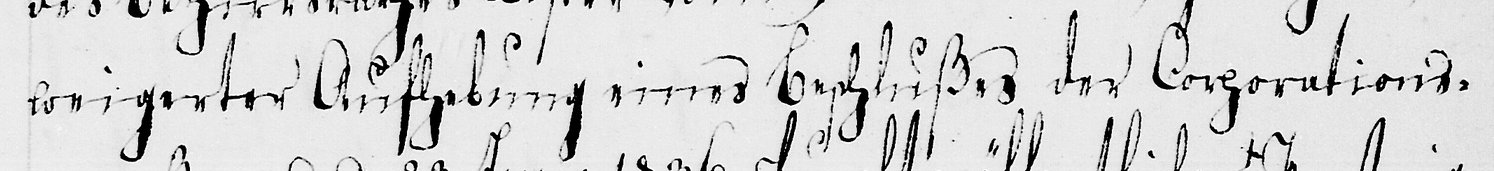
weigerter Aufhebung eines Beschlußes der Corporations¬
